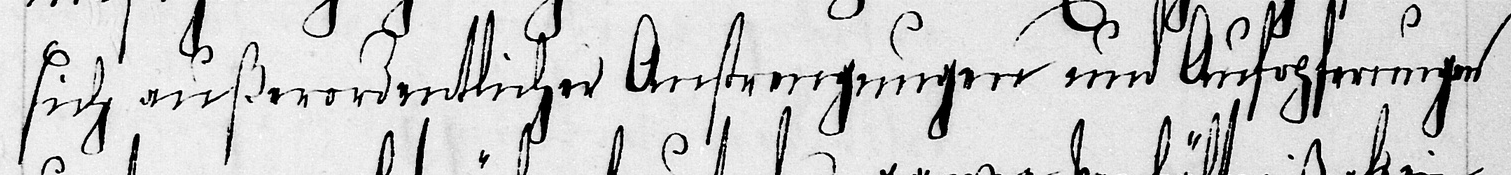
sich außerordentlicher Anstrengungen und Aufopferungen
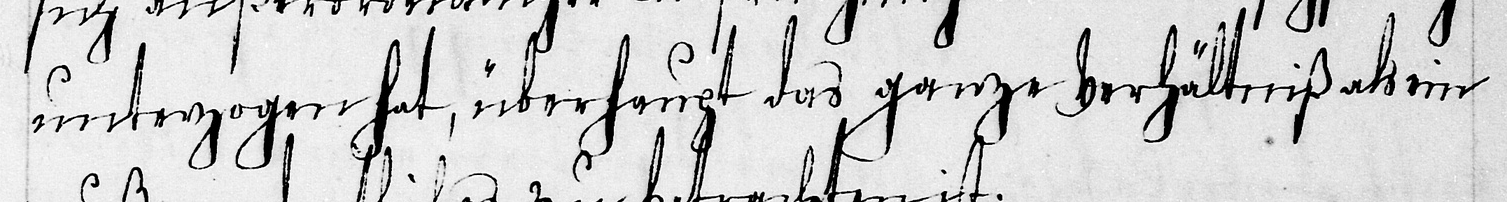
unterzogen hat, überhaupt das ganze Verhältniß als ein
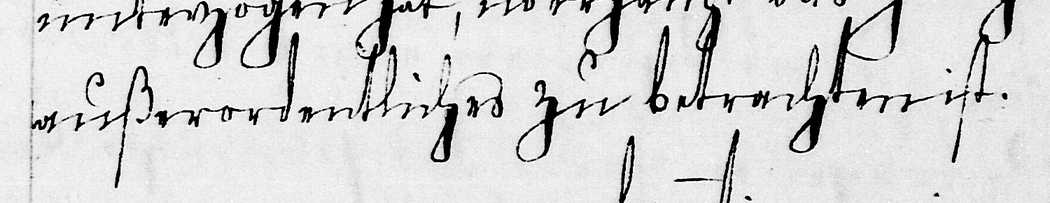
außerordentliches zu betrachten ist.
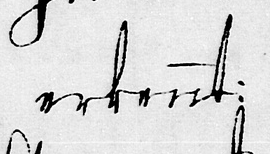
erkennt:
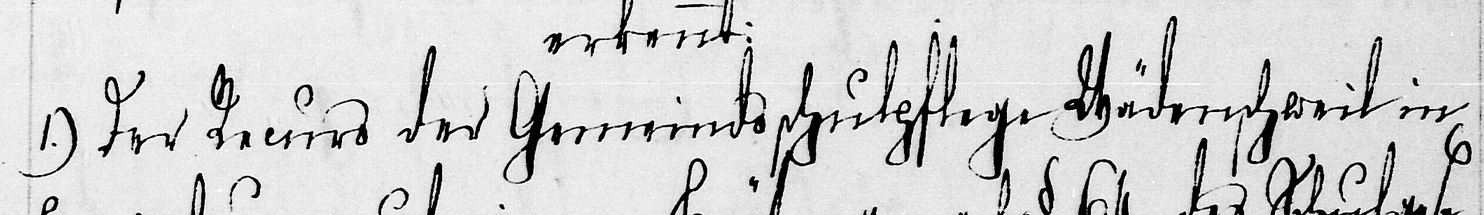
1.) Der Recurs der Gemeindsschulpflege Wädenschweil in
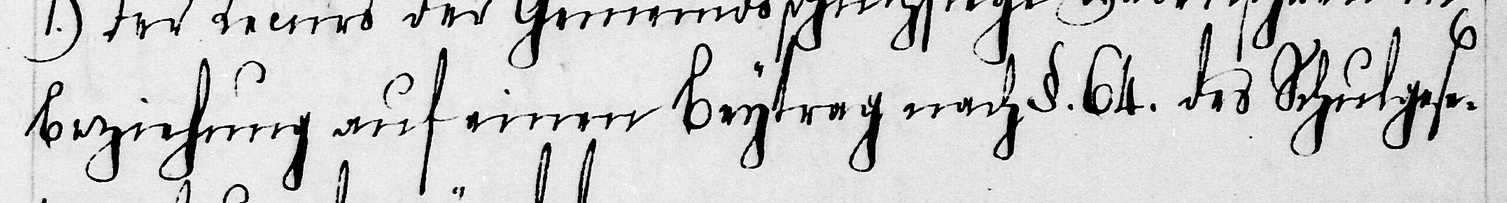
Beziehung auf einen Beytrag nach §. 64. des Schulgese¬
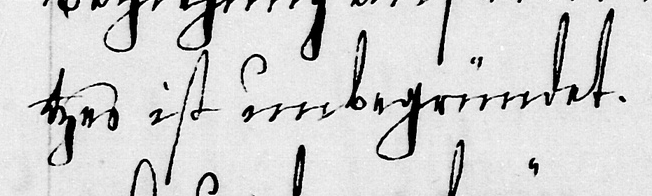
tzes ist unbegründet.
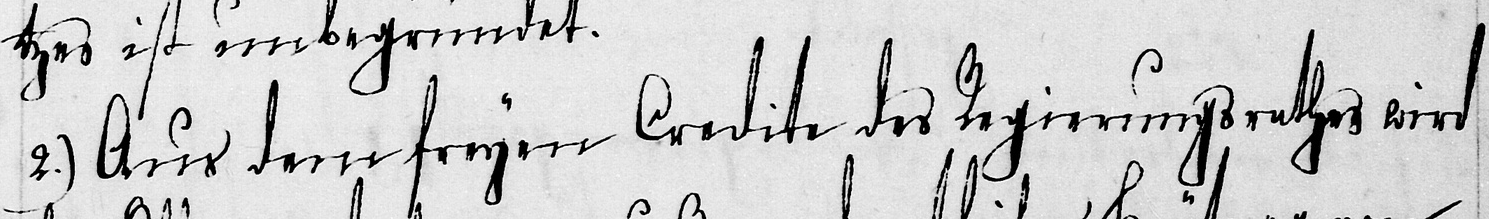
2.) Aus dem freyen Credite des Regierungsrathes wird
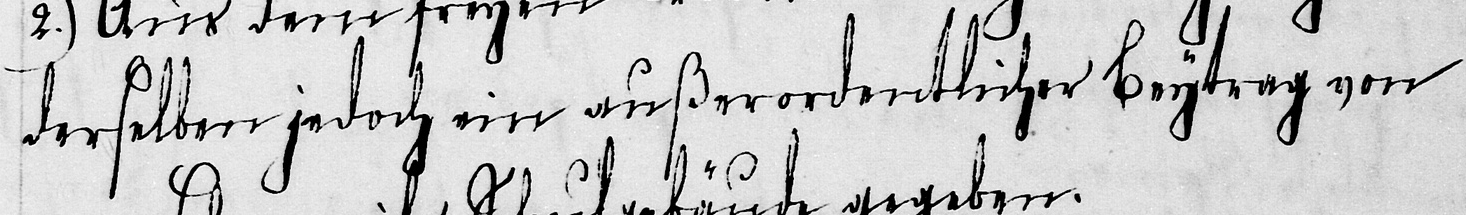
derselben jedoch ein außerordentlicher Beytrag von
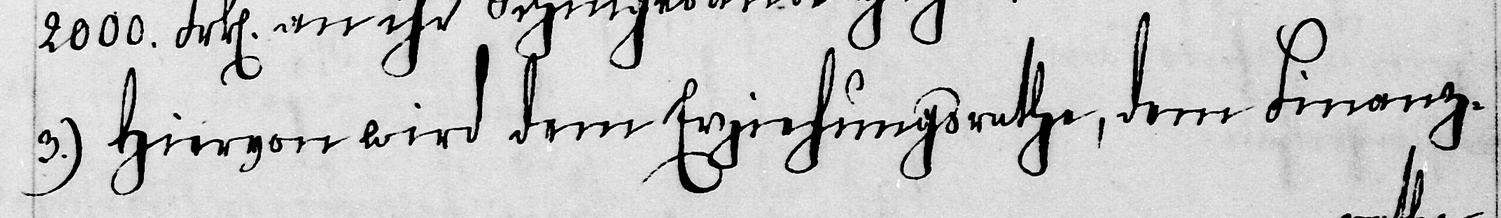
3.) Hiervon wird dem Erziehungsrathe, dem Finanz-
